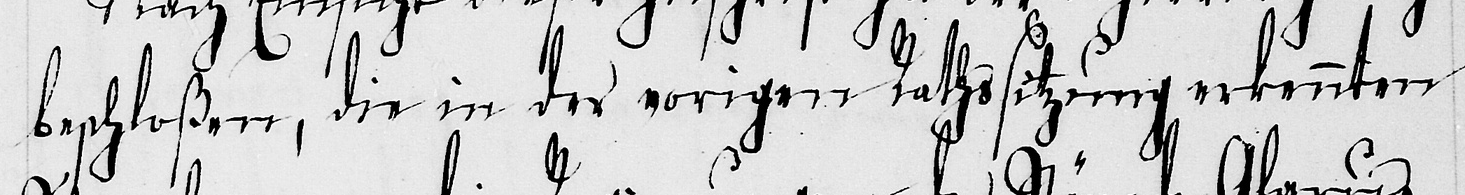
beschloßen, die in der vorigen Rathssitzung erkennten
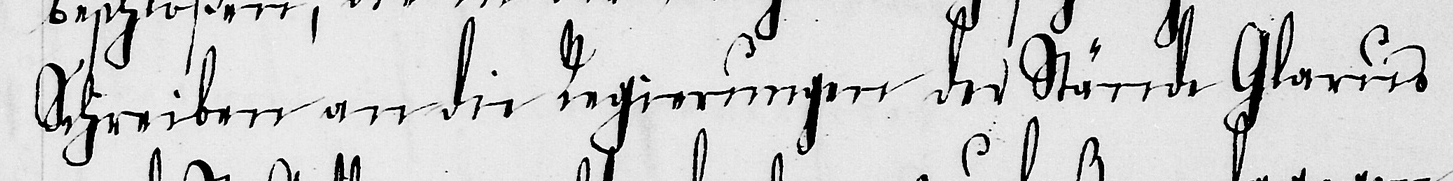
Schreiben an die Regierungen der Stände Glarus
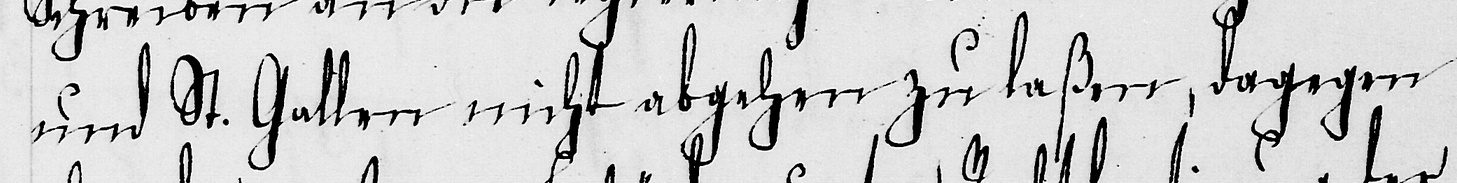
und St. Gallen nicht abgehen zu laßen, dagegen
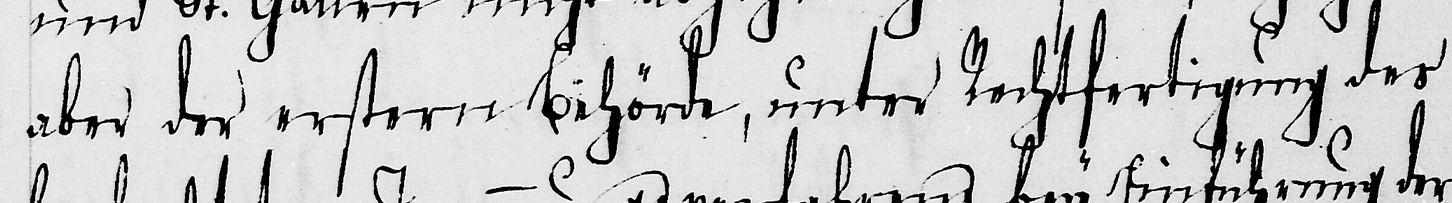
aber der erstern Behörde, unter Rechtfertigung des
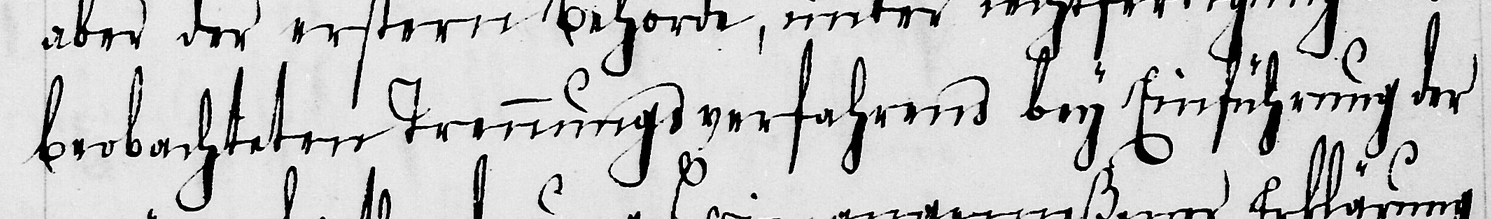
beobachteten Trennungsverfahrens bey Einführung der
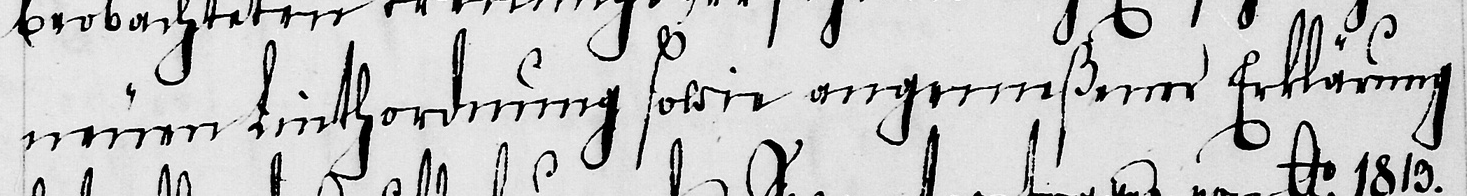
neuen Linthordnung sowie angemeßener Erklärung
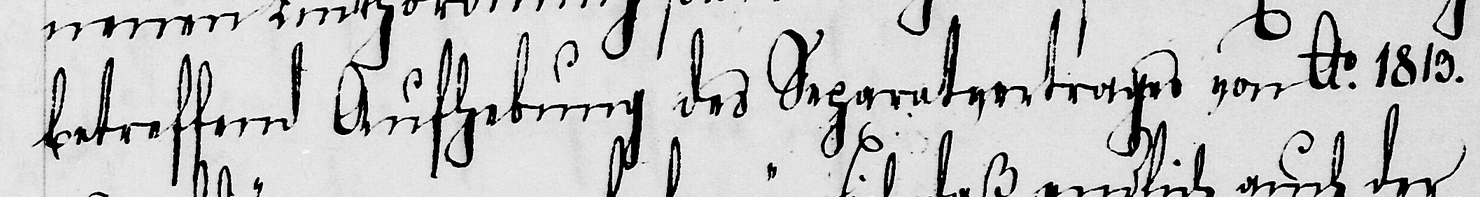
betreffend Aufhebung des Separatvertrages von A°. 1813.
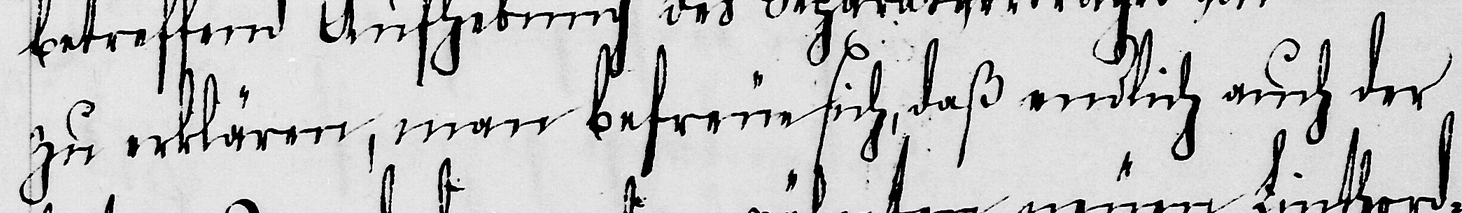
zu erklären, man befreue sich, daß endlich auch der
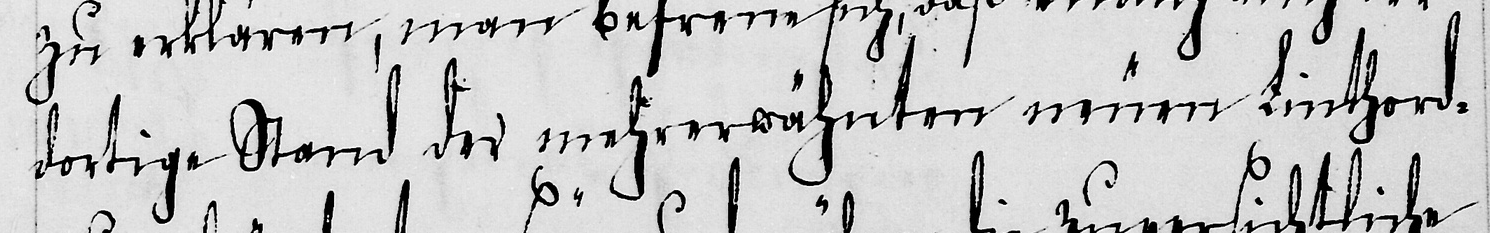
dortige Stand der mehrerwähnten neuen Linthord¬
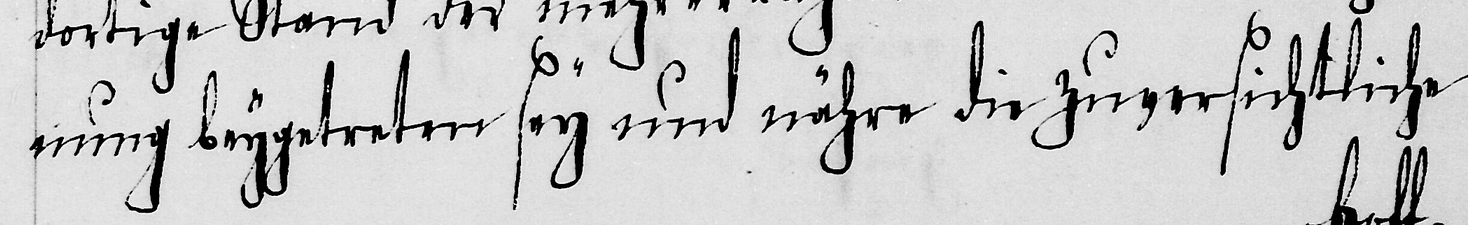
nung beygetreten sey und nähre die zuversichtliche
